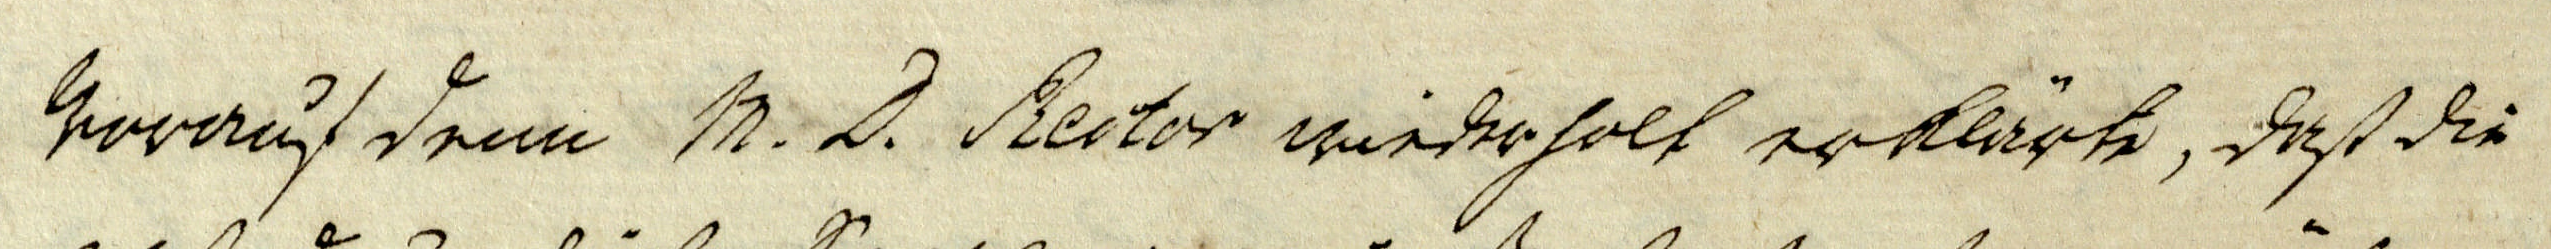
Worauf denn M. D. Rector wiederholt erklärte, daß die
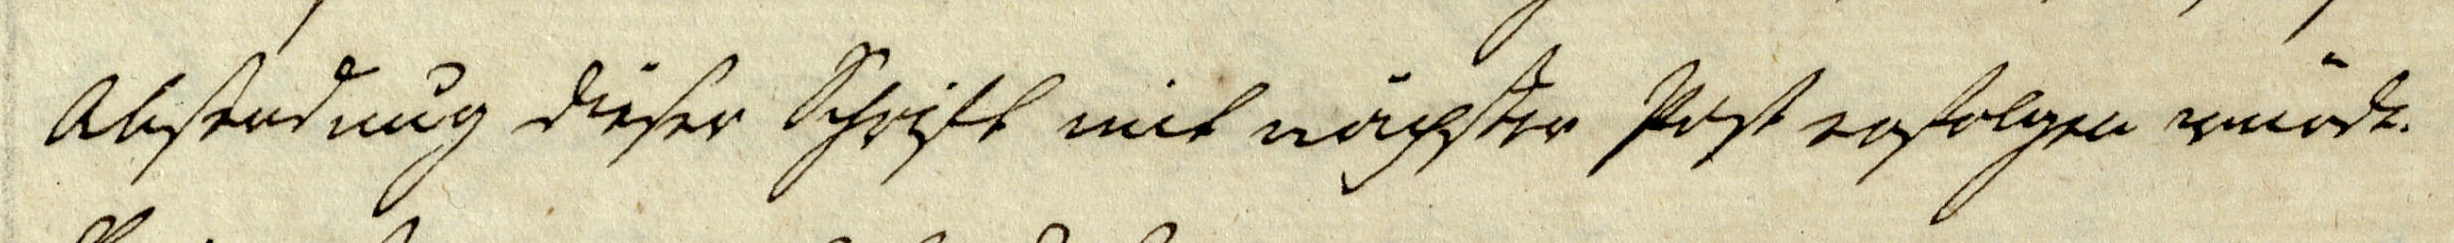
Absendung dieser Schrift mit nächster Post erfolgen würde.
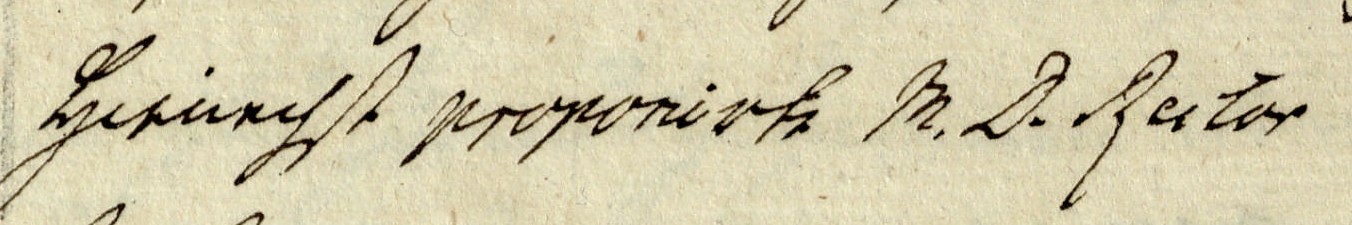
Hienechst proponirte M. D. Rector
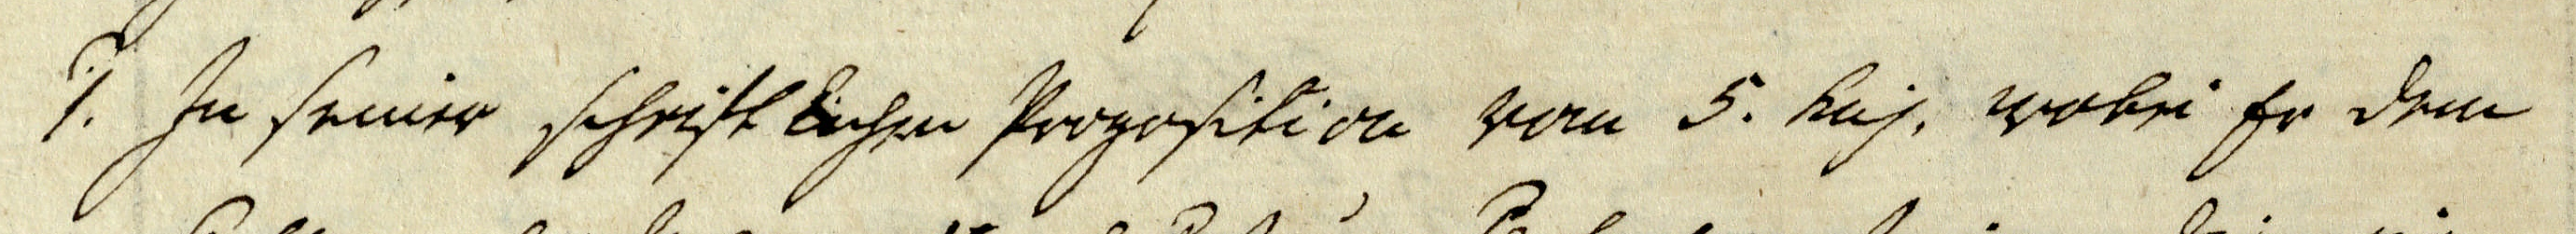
1. zu seiner schriftlichen Proposition vom 5. huj. wobei Er dem
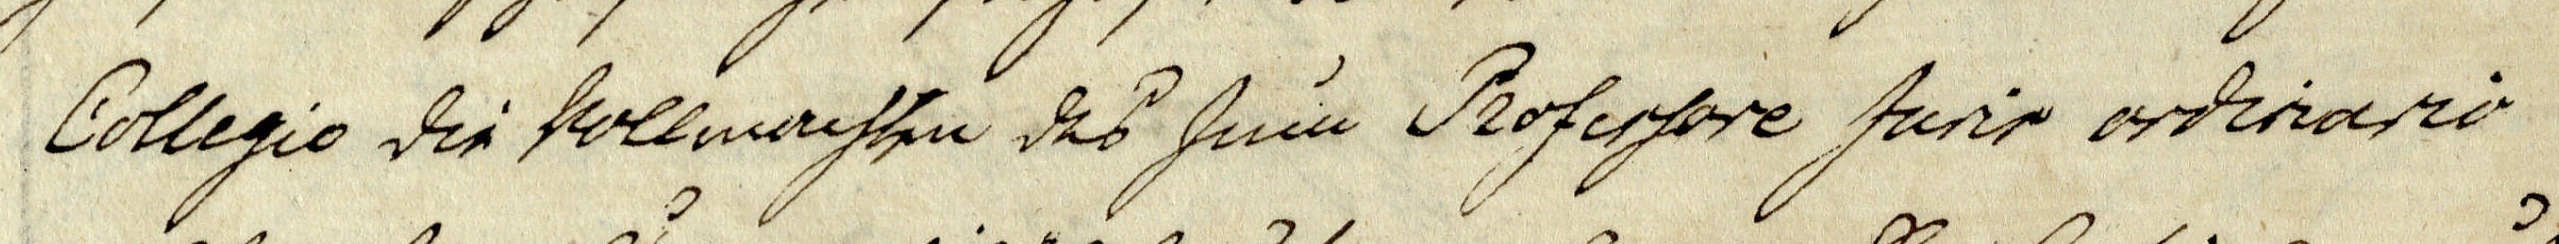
Collegio die Vollmachten des zum Professore Juris ordinario
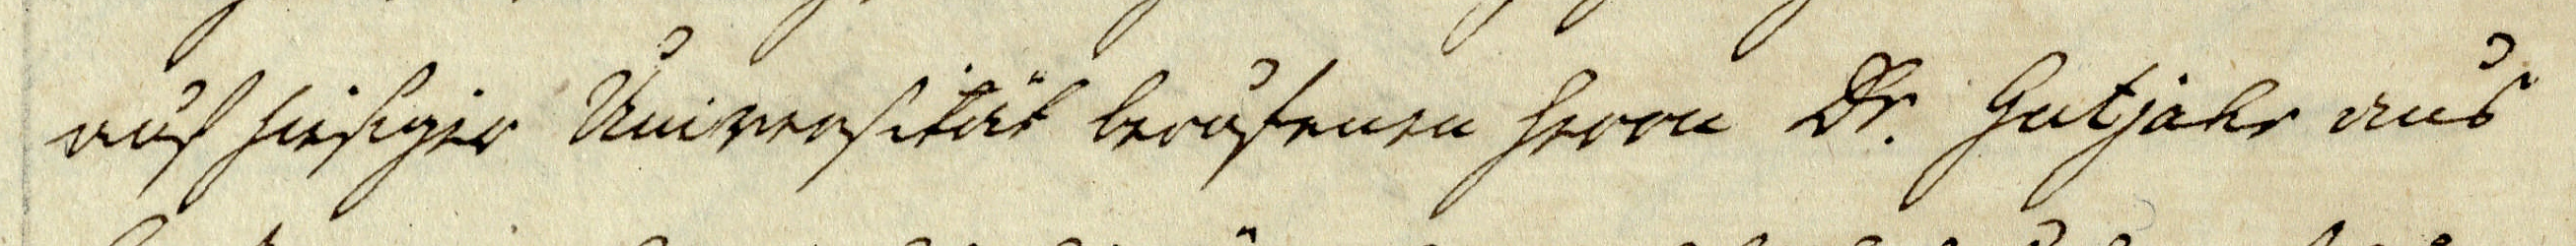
auf hiesiger Universität berufenen Herrn Dr. Gutjahr aus
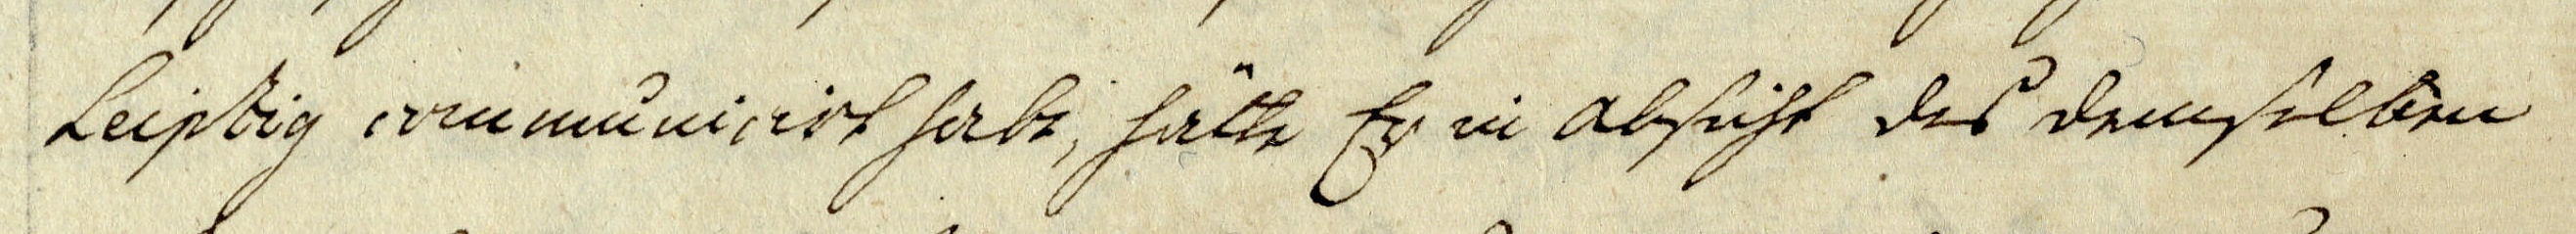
Leipzig communicirt habe, hätte Er in Absicht des demselben
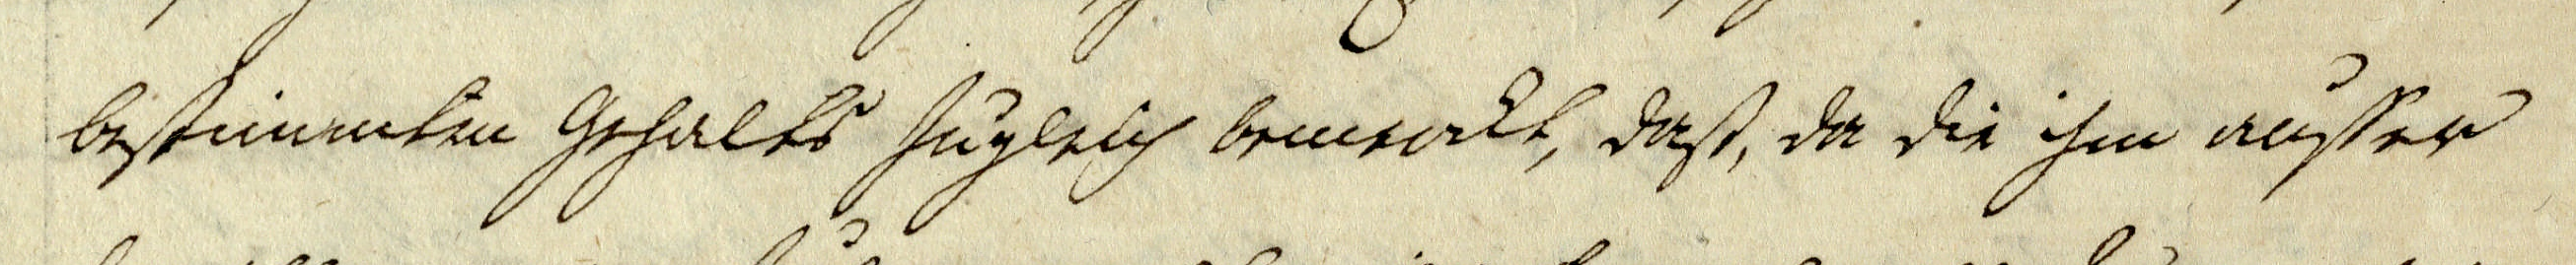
bestimmten Gehalts zugleich bemerckt, daß, da die ihm ausser
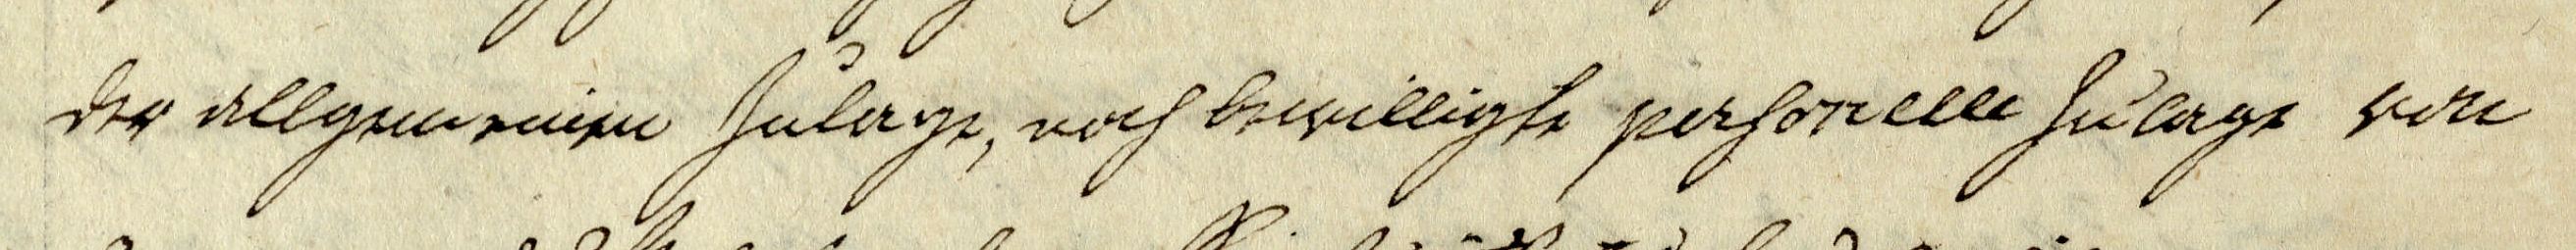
der allgemeinen Zulage, noch bewilligte personelle Zulage von
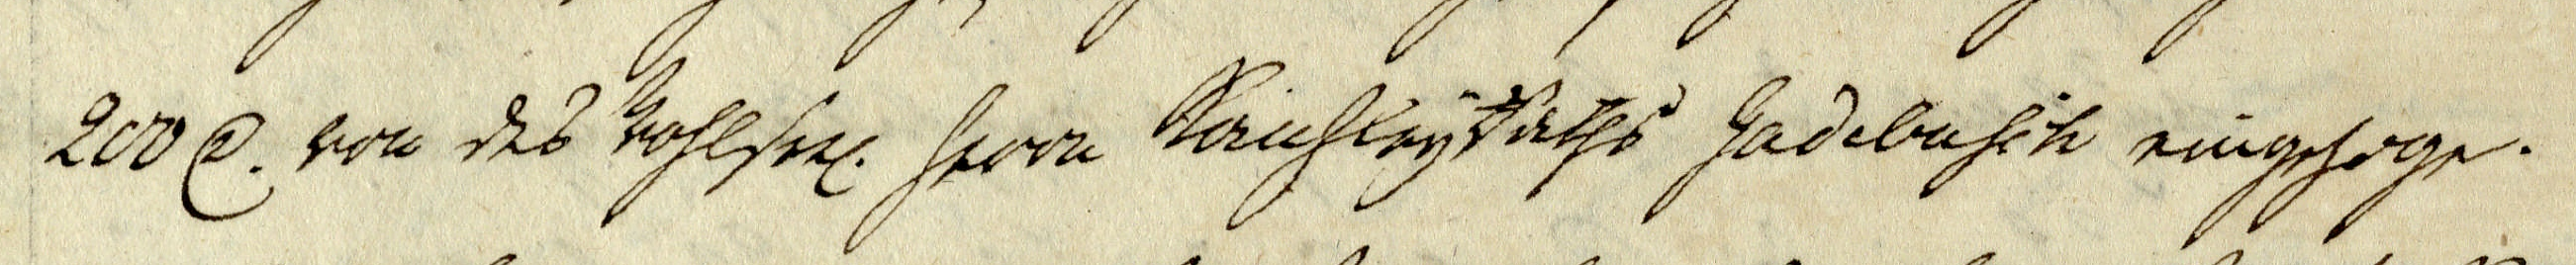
200 l. von des Wohlseel. Herrn KanzleÿRaths Gadebusch eingezoge¬
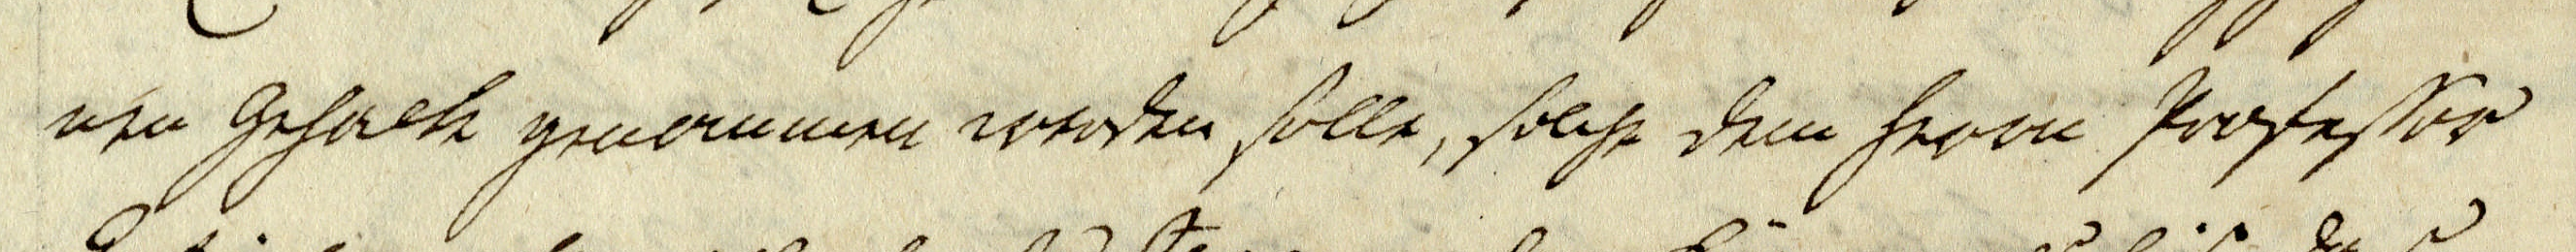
nen Gehalte genommen werden solle, solche dem Herrn Professor
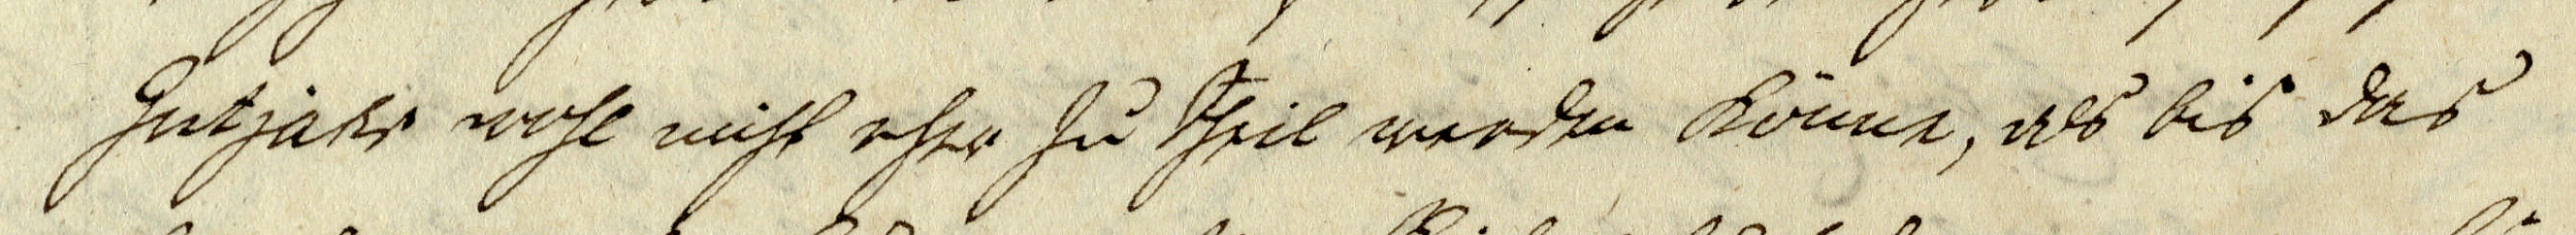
Gutjahr wohl nicht eher zu Theil werden könne, als bis das
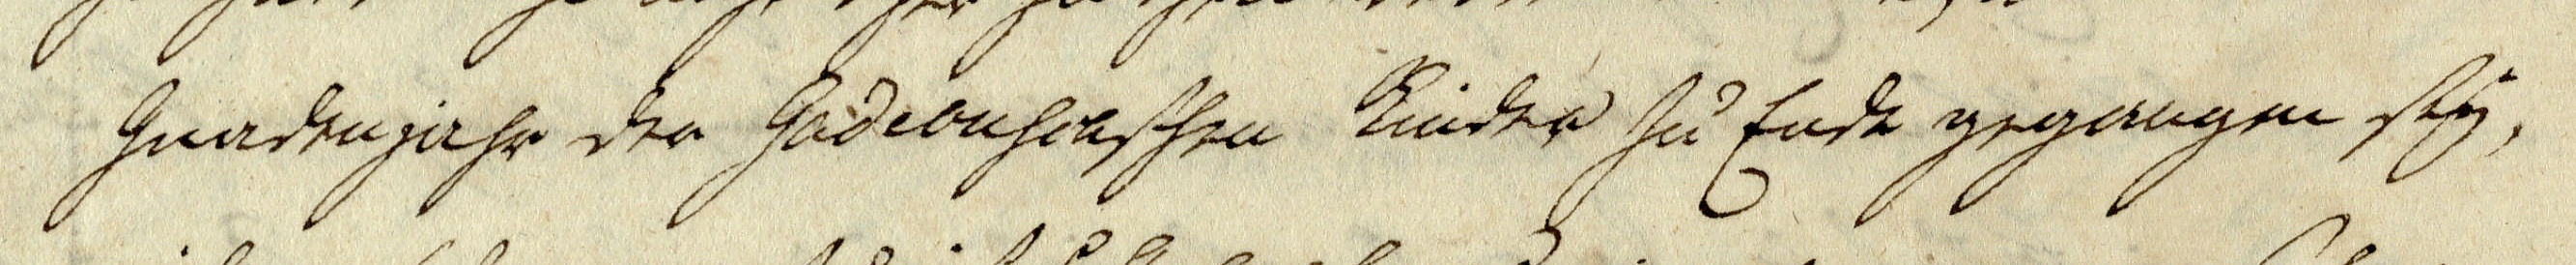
Gnadenjahr der Gadebuschschen Kinder zu Ende gegangen seÿ,
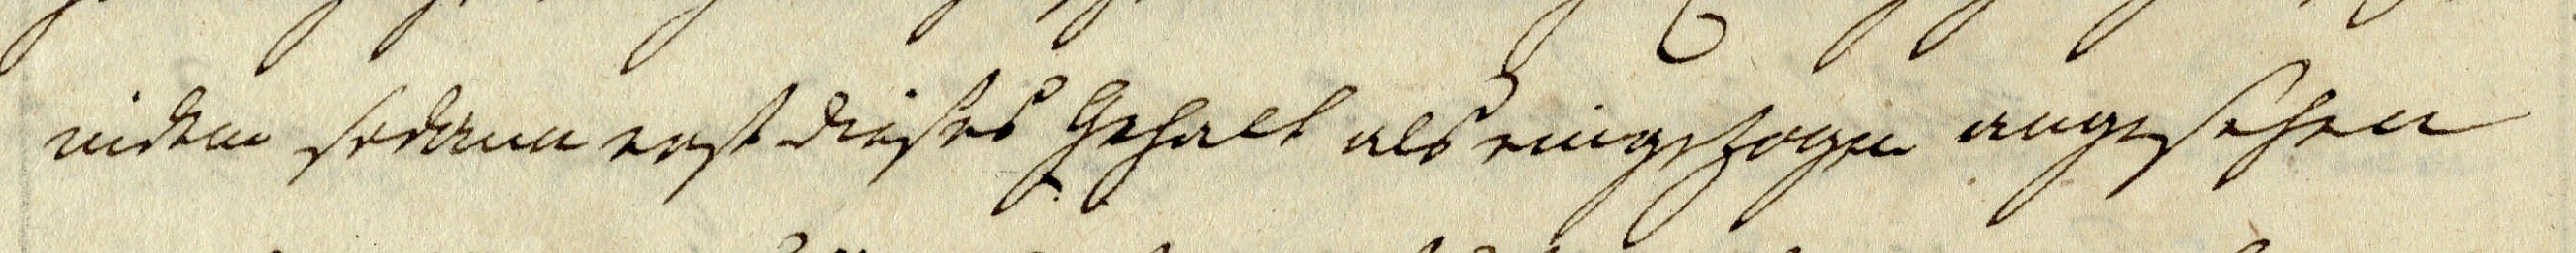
indem sodann erst dieses Gehalt als eingezogen angesehen
